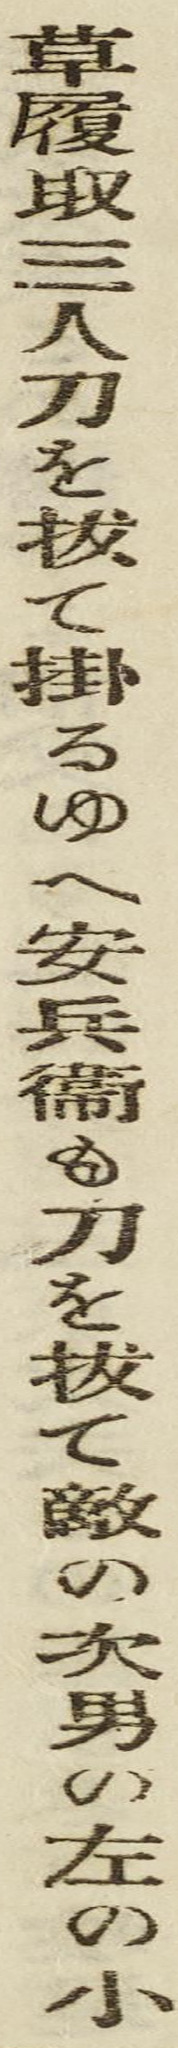草履取三人刀を抜て掛るゆへ安兵衛も刀を抜て敵の次男の左の小
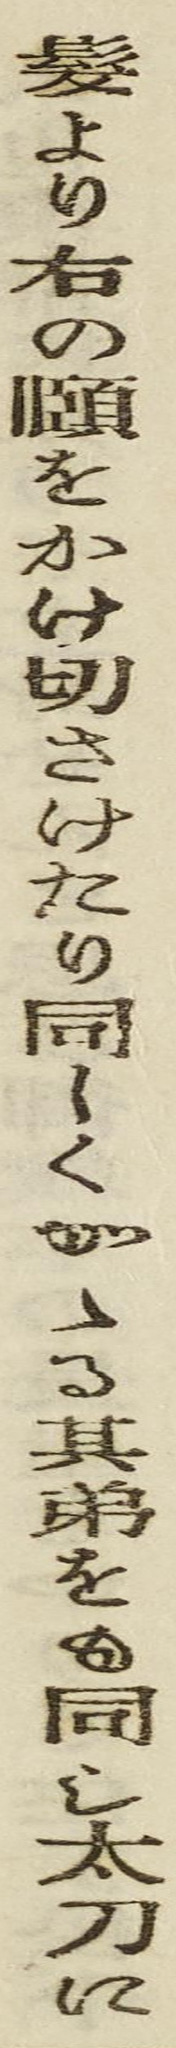髪より右の頤をかけ切さけたり同しくかゝる其弟をも同し太刀に
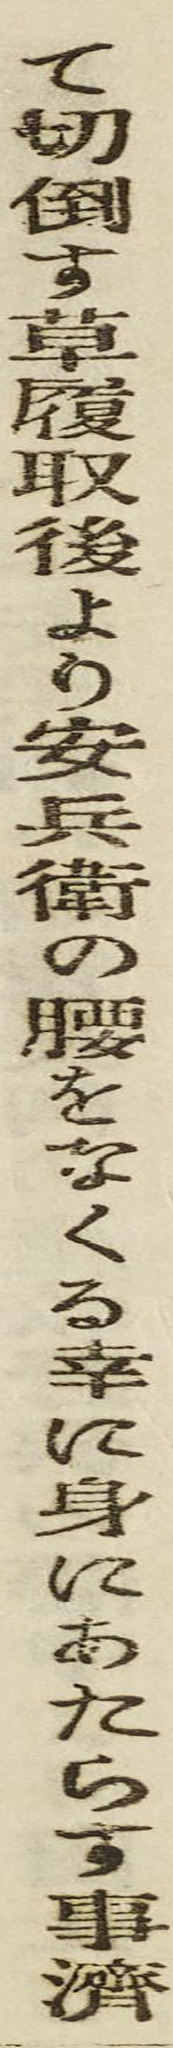て切倒す草履取後より安兵衛の腰をなくる幸に身にあたらす事済
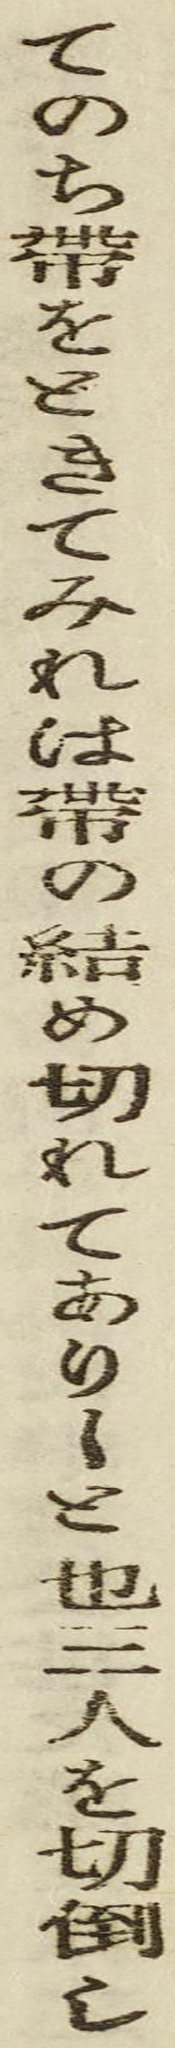てのち帯をときてみれは帯の結め切れてありしと也二人を切倒し
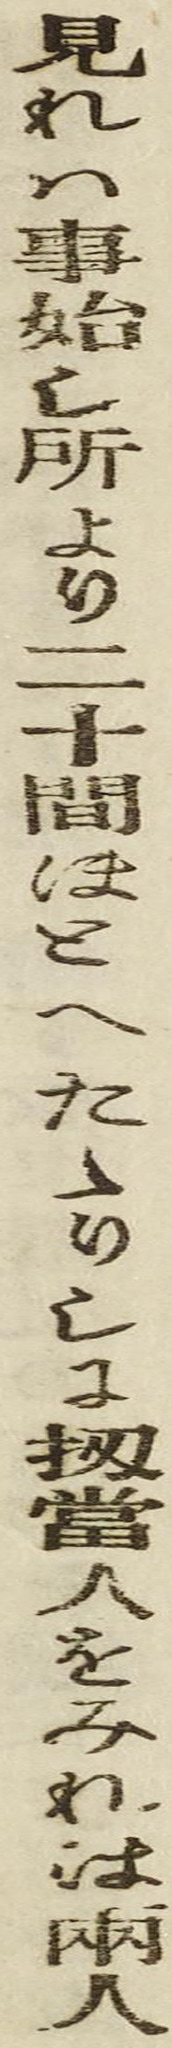見れハ事始し所より二十間ほとへたゝりしに扨当人をみれは両人
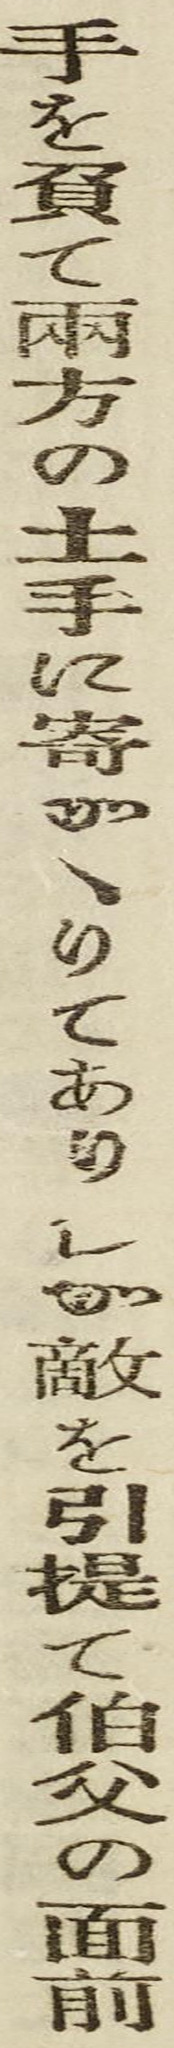手を負て両方の土手に寄かゝりてありしか敵を引提て伯父の面前
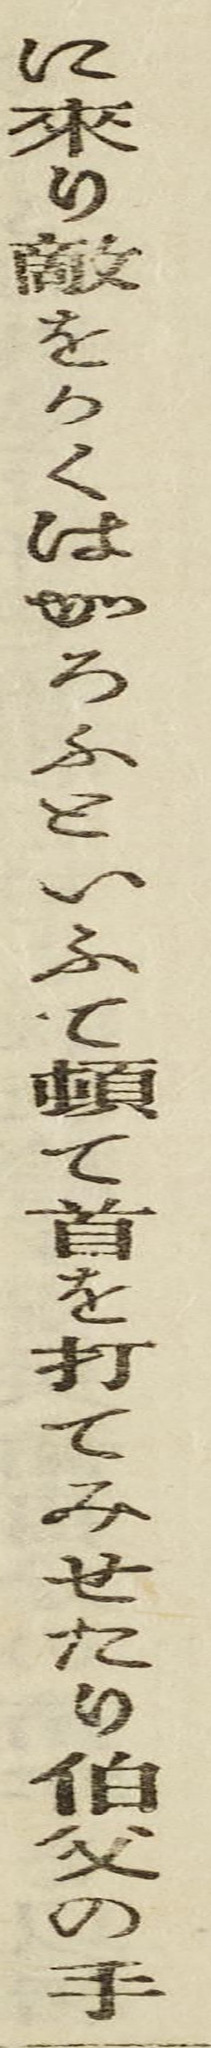に来り敵をかくはかろふといふて頓て首を打てみせたり伯父の手
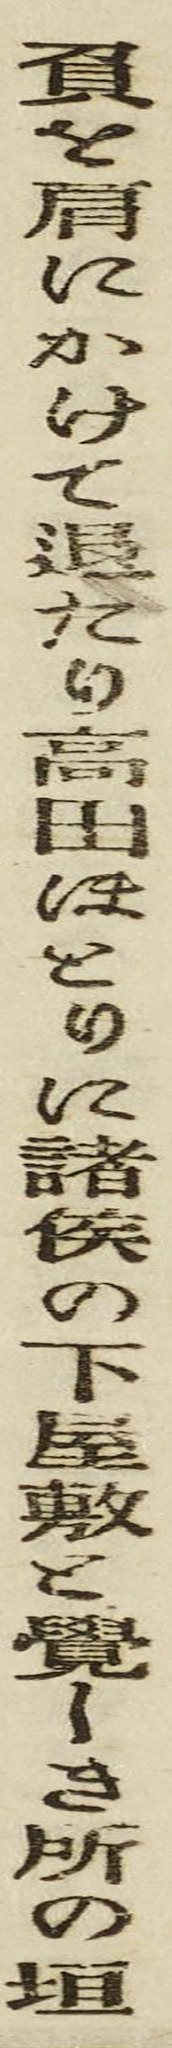負を肩にかけて退たり高田ほとりに諸侯の下屋敷と覚しき所の垣
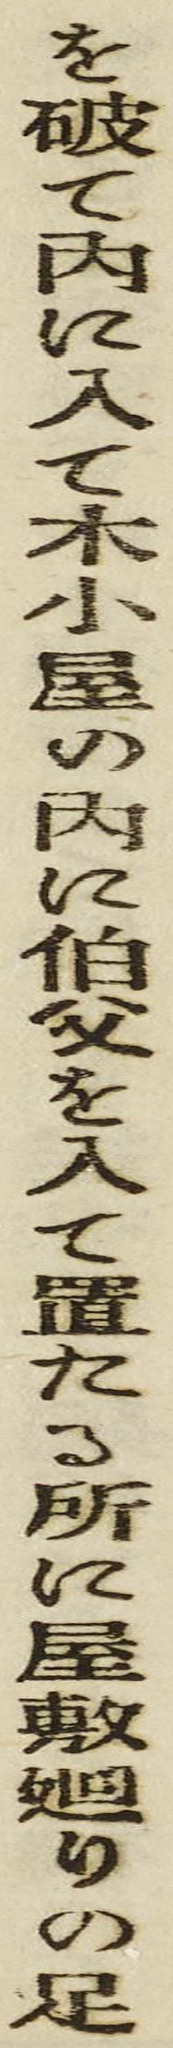を破て内に入て木小屋の内に伯父を入て置たる所に屋敷廻りの足
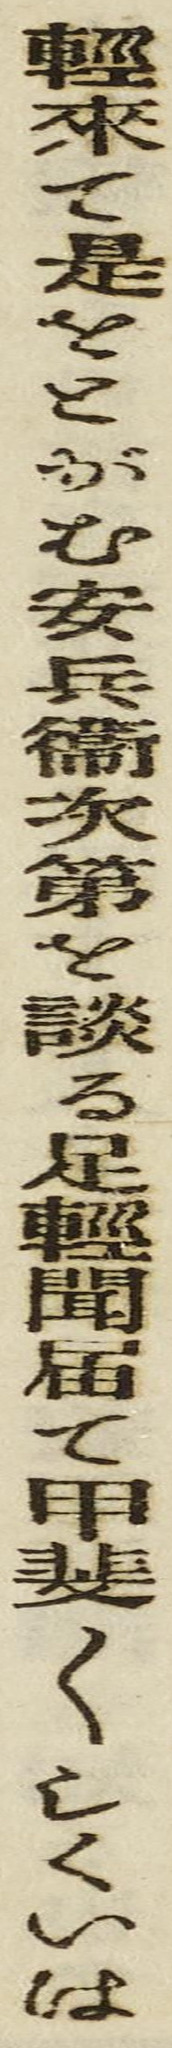軽来て是をとがむ安兵衛次第を談る足軽聞届て甲斐〳〵しくいは
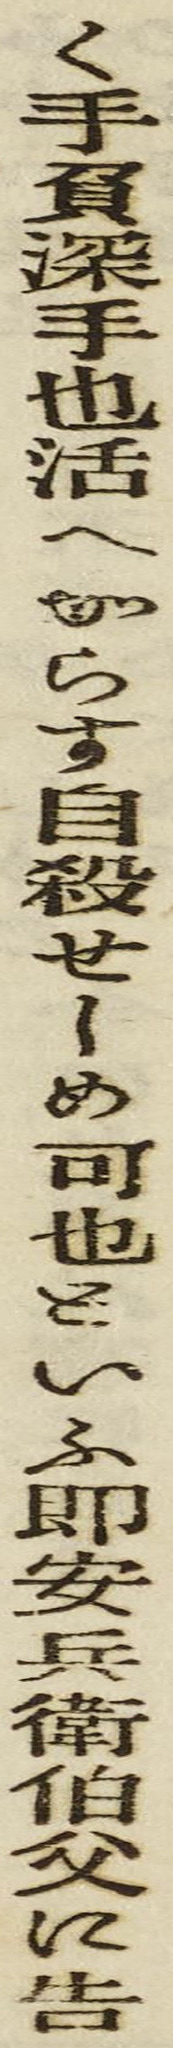く手負深手也活へからす自殺せしめ可也といふ即安兵衛伯父に告
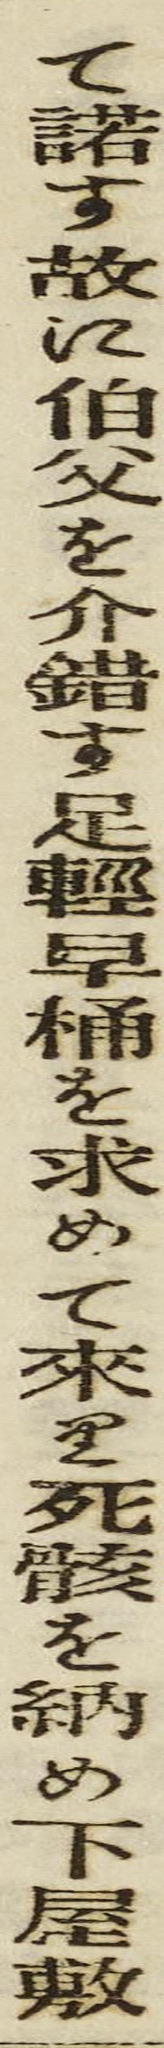て諾す故に伯父を介錯す足軽早桶を求めて来り死骸を納め下屋敷
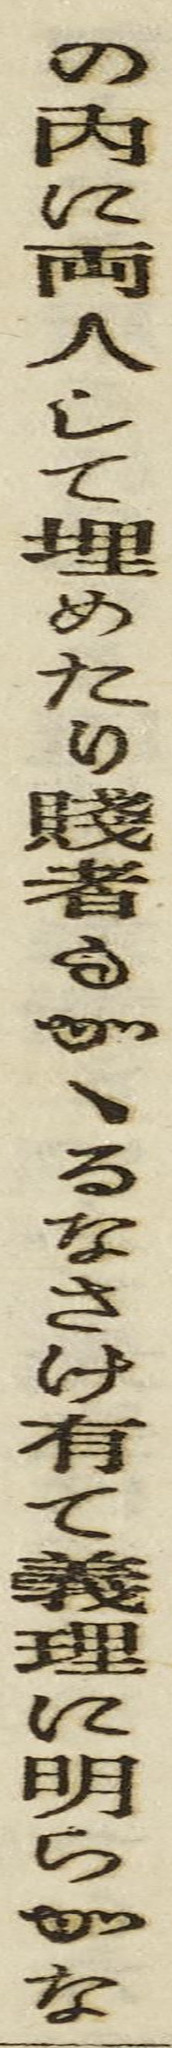の内に両人して埋めたり賎者もかゝるなさけ有て義理に明らかな
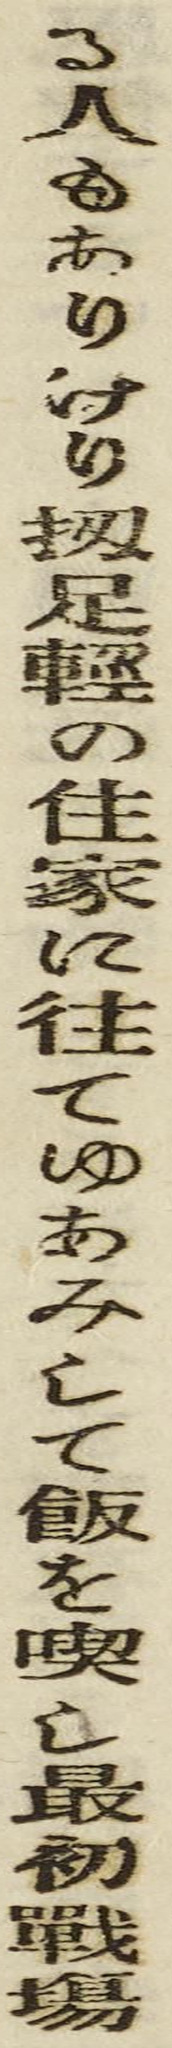る人もありけり扨足軽の住家に往てゆあみして飯を喫し最初戦場
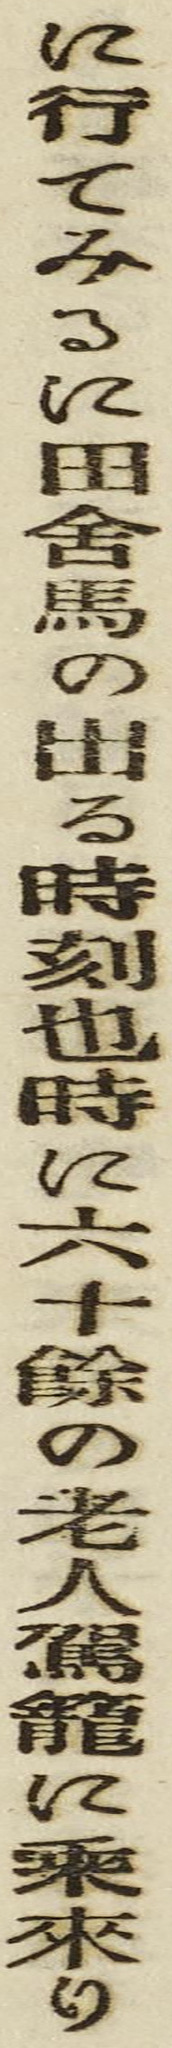に行てみるに田舎馬の出る時刻也時に六十余の老人駕籠に乗来り
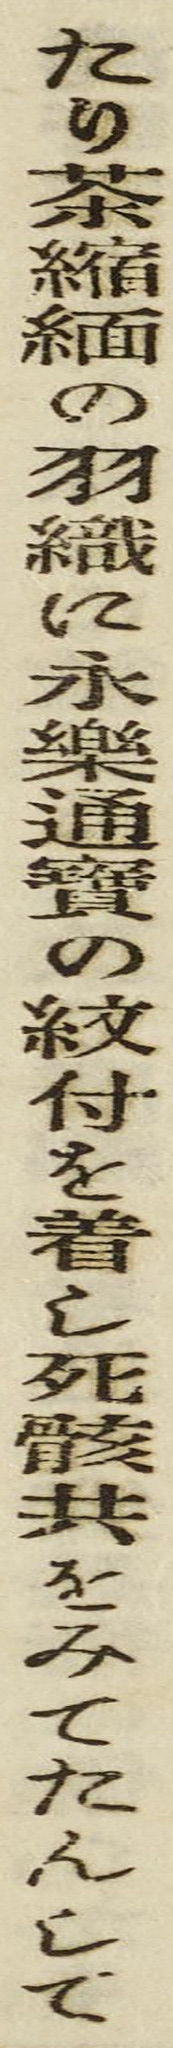たり茶縮緬の羽織に永楽通宝の紋付を着し死骸共をみてたんして
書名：史籍集覽　朝鮮陣古文・細井廣澤記・颶風紀事・天明七年將軍宣下次第書　全
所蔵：東京大学地震研究所図書室 Earthquake Research Institute Library, The University of Tokyo, JAPAN
